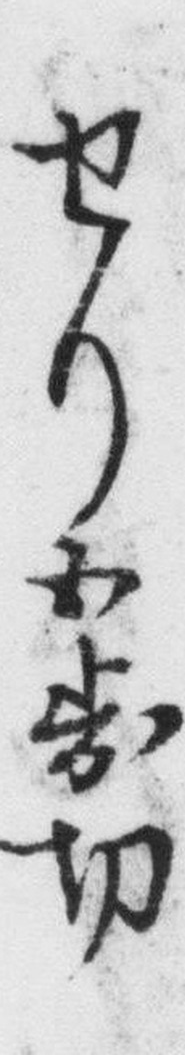せり五歩切
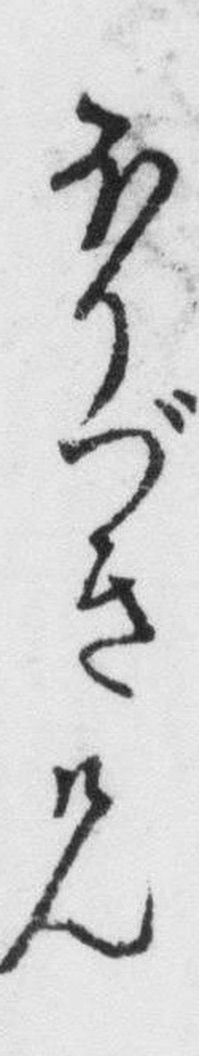不りづきけん飯
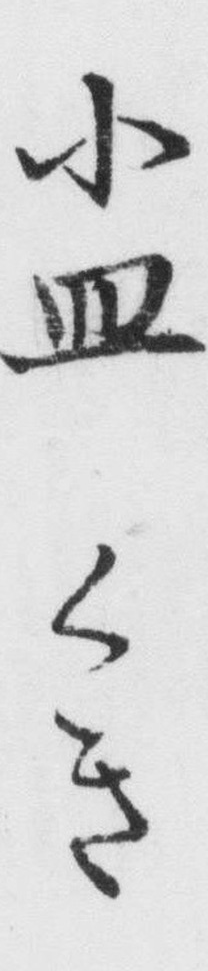小皿くき

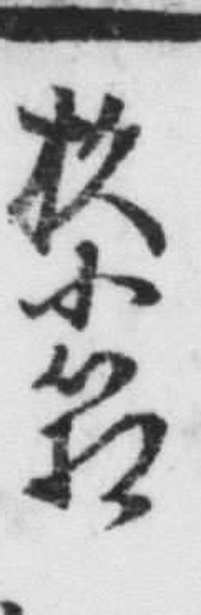杦小箱
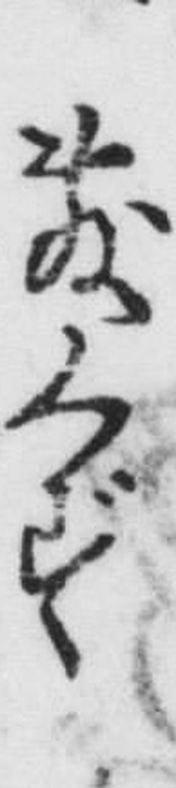敷くず
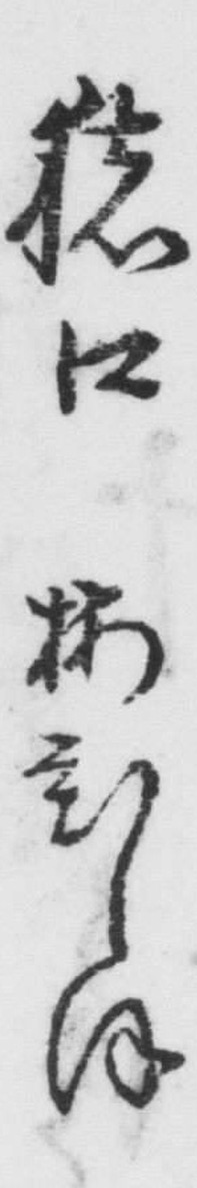猪口梅飛しほ
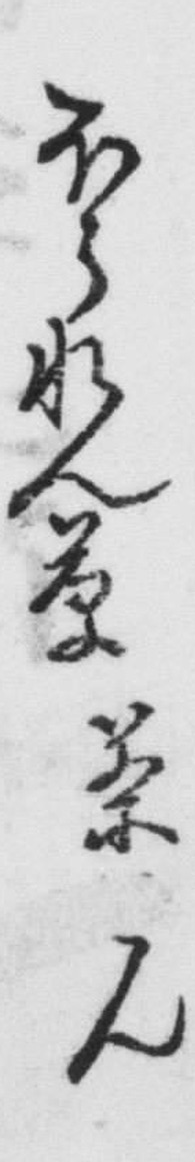不うれん草茶わん
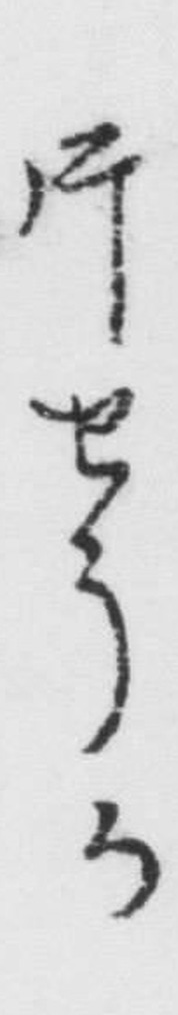片せうか
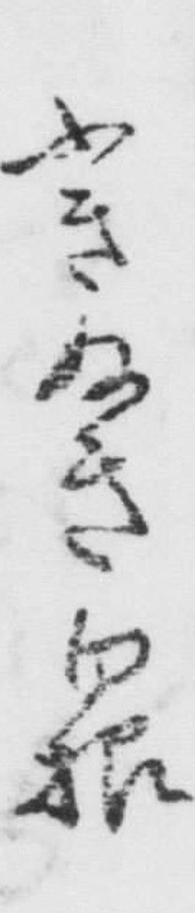ふきぬき白根

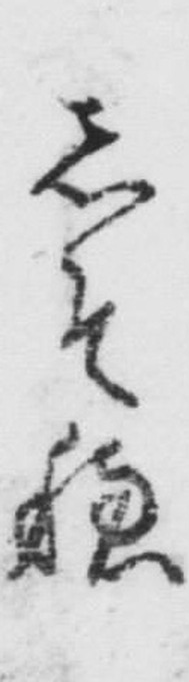志そ穂
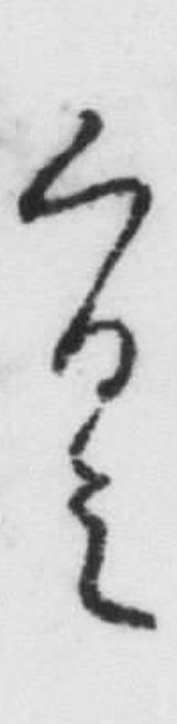くるみ
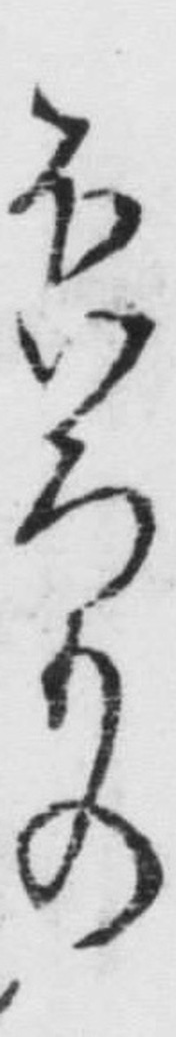不いろもの
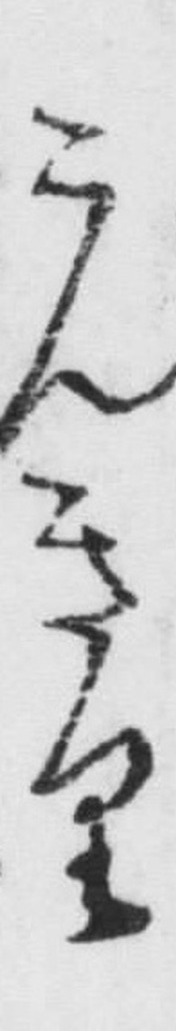こんき里
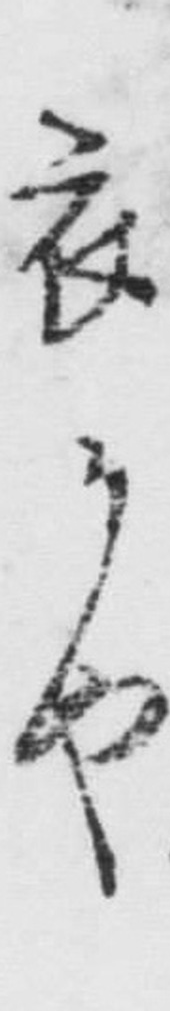衣かや

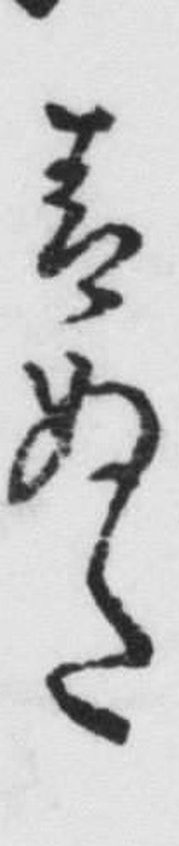青ぬた

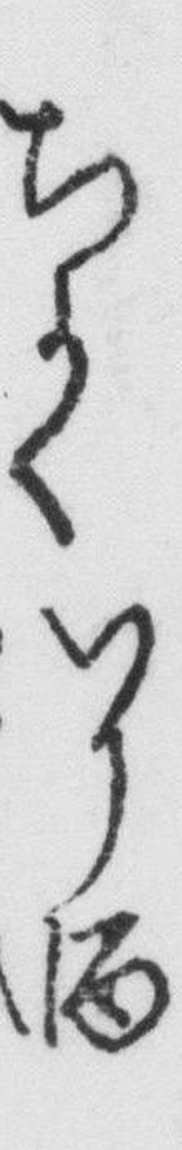ちよくいり酒飯
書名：普茶料理抄
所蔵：大阪府立大学学術情報センター 国文学研究資料館
